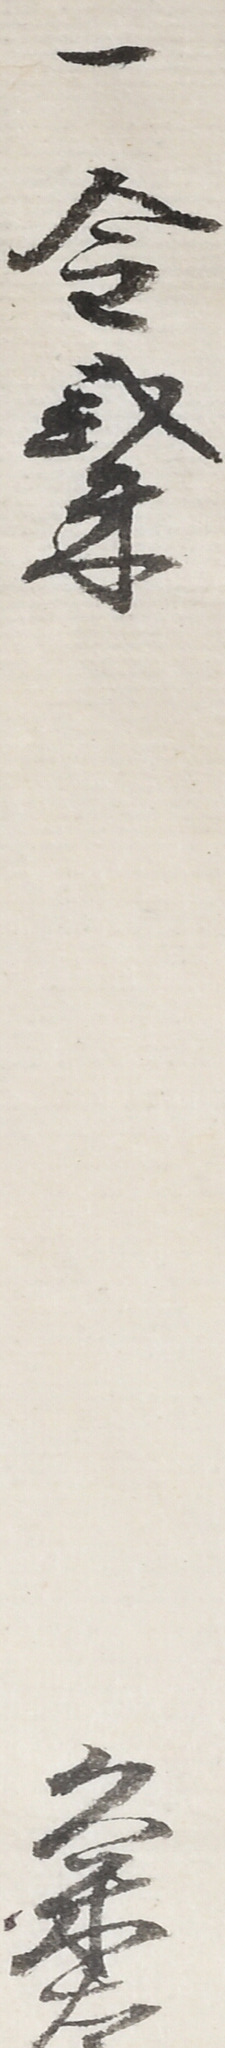一金弐朱久米右衛門
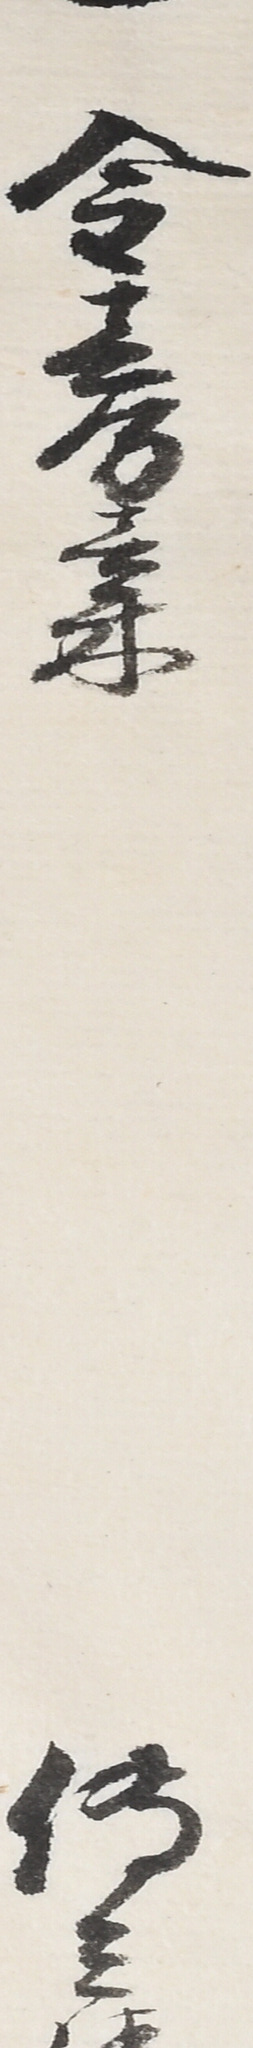一金壱分壱朱伝兵衛
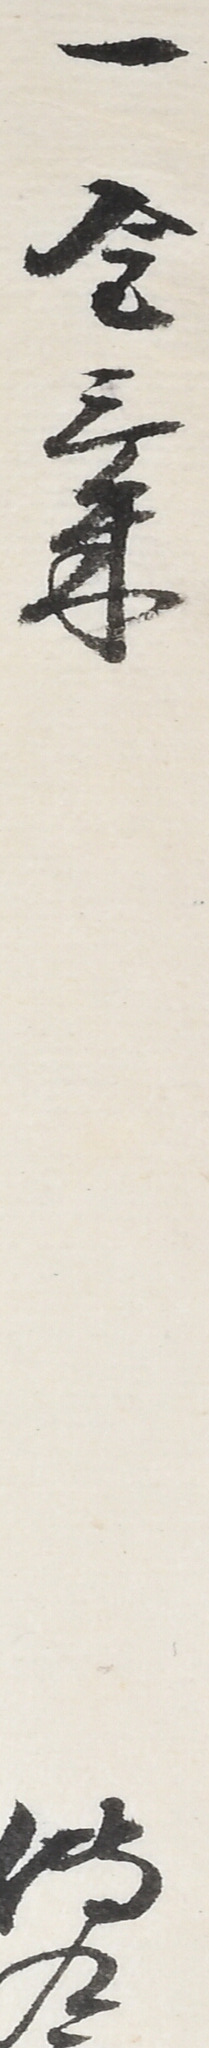一金三朱伝九郎
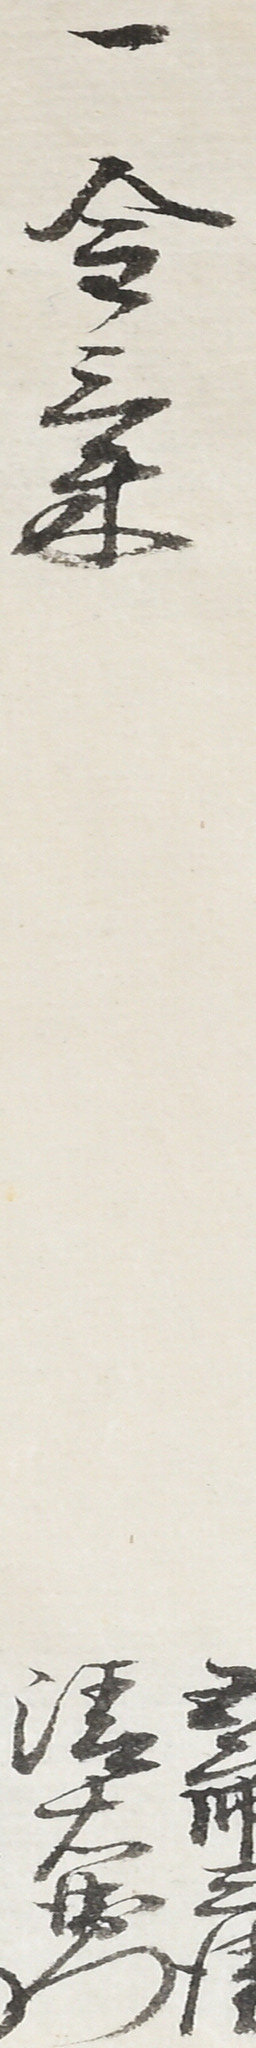一金三朱清右衛門
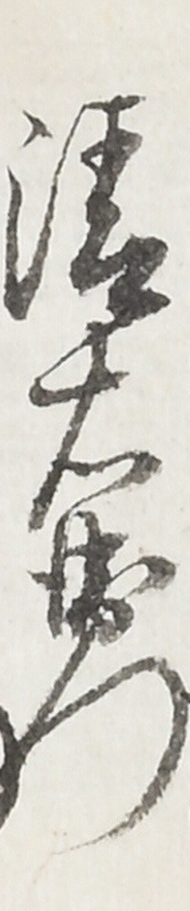喜右衛門
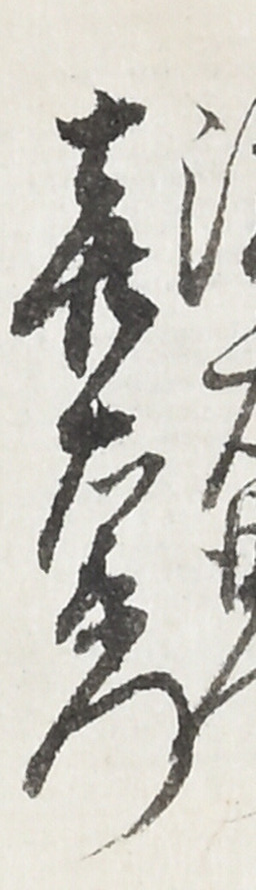喜右衛門
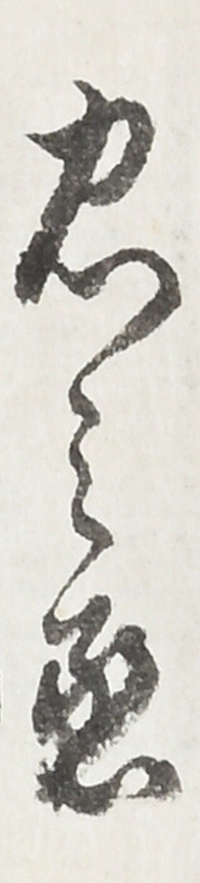忠之丞
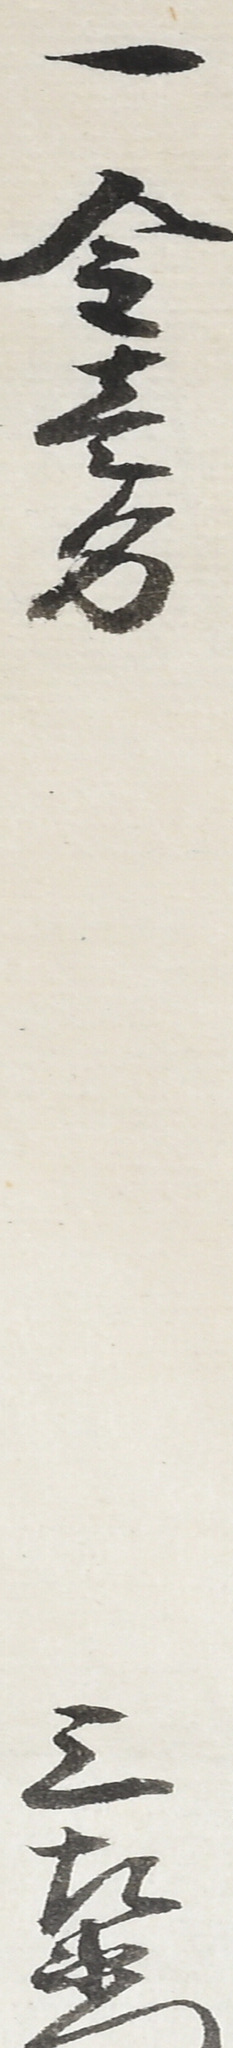一金壱分三左衛門
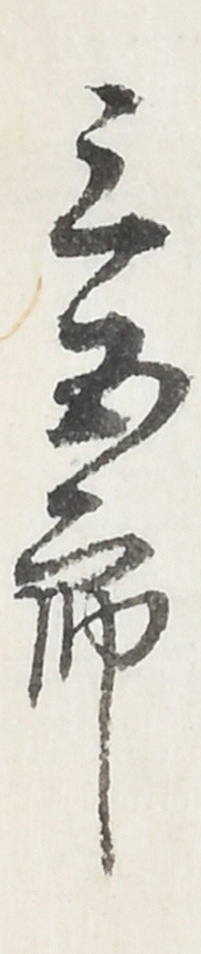三五郎

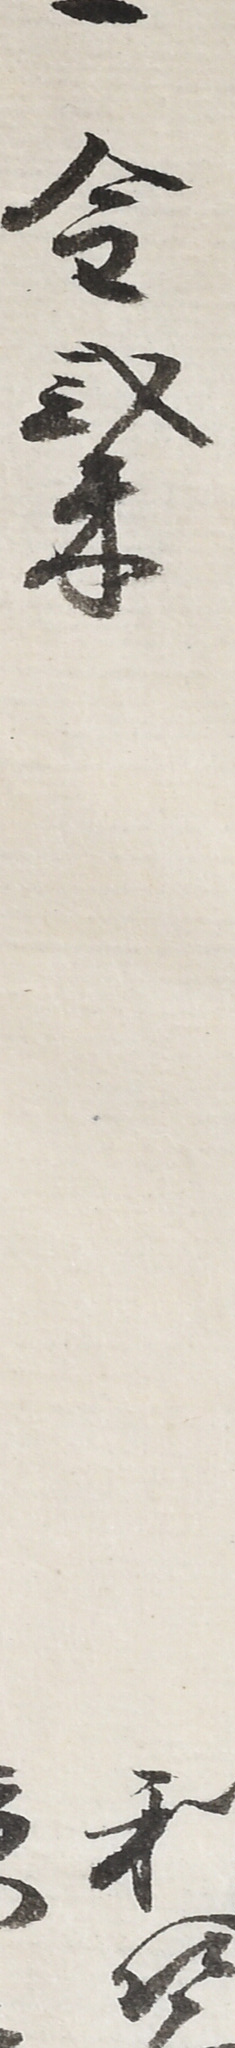一金弐朱蔵
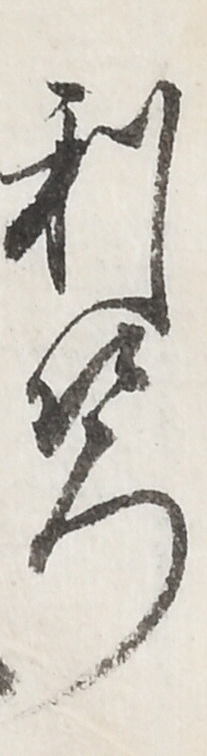利左衛門
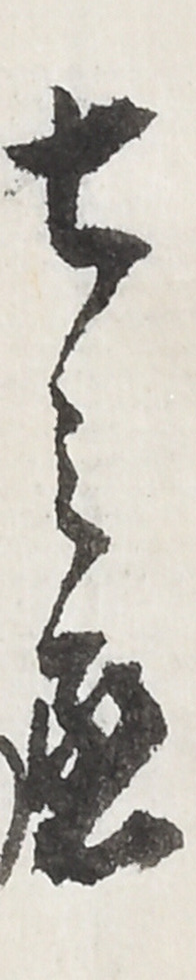作之丞
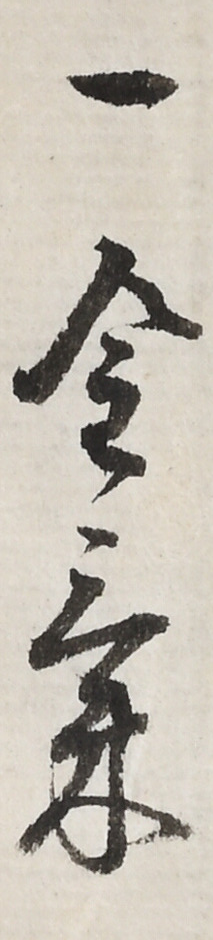一金弐朱蔵
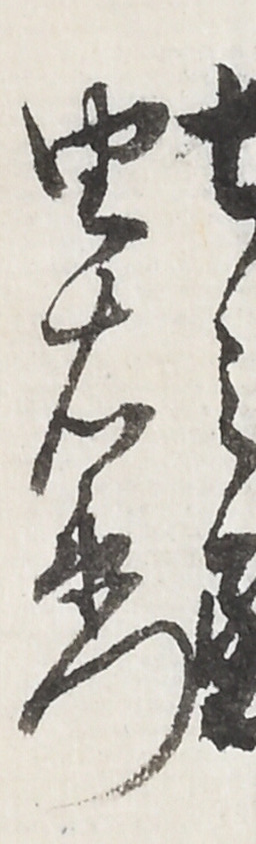由右衛門
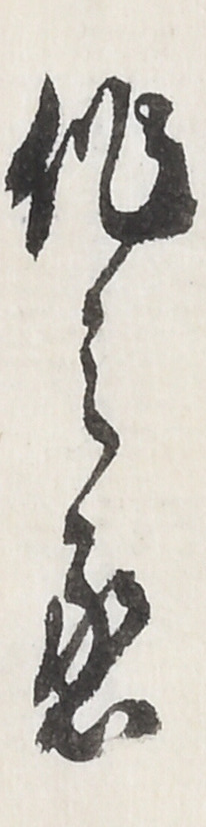作之丞
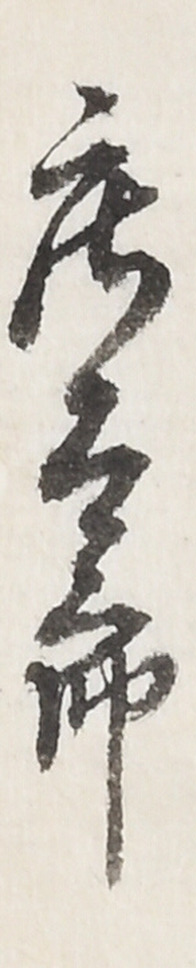庄五郎
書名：御拝地百五拾年御祝儀献上御目録名前
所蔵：伊那市立高遠町図書館・合同会社AMANE
